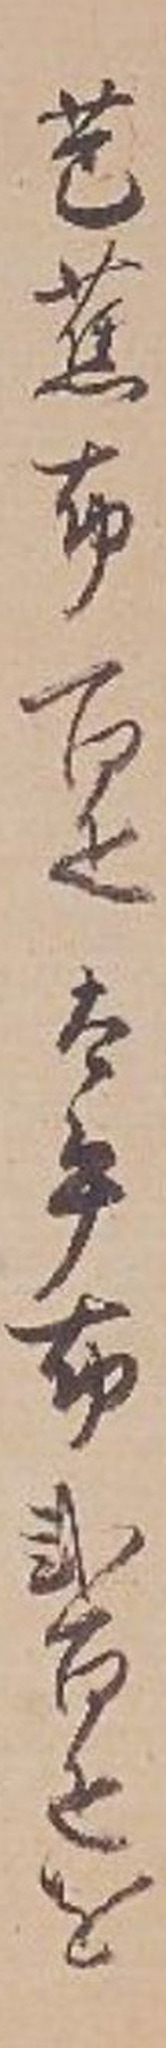芭蕉布百疋太平布弐百疋を
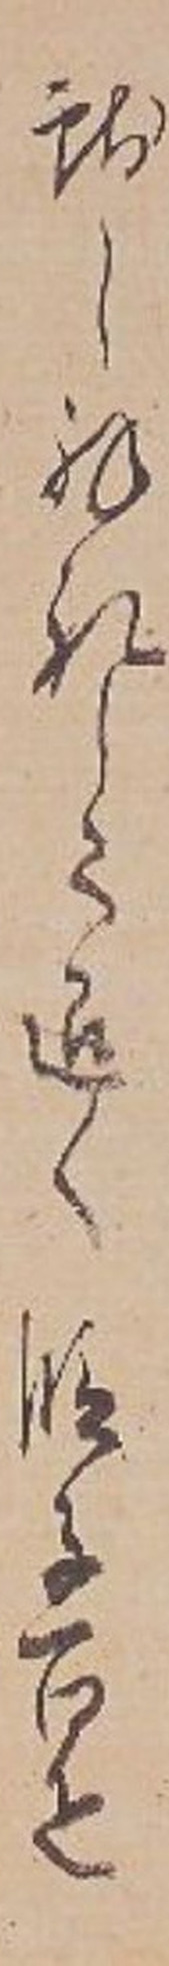献し拝礼して退く緞子百疋
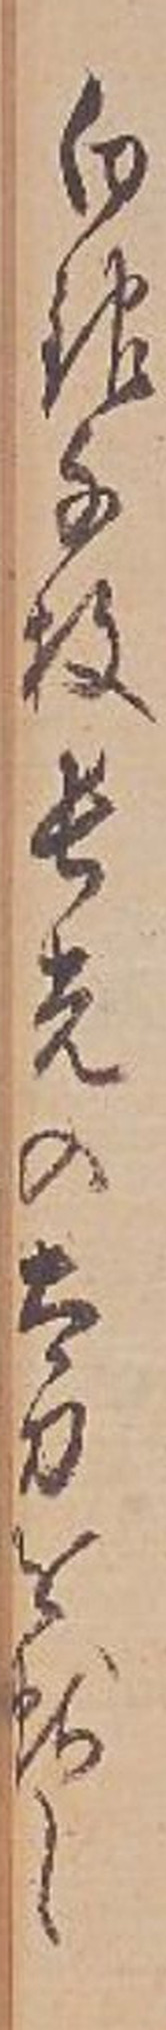白銀千枚長光の太刀を献し
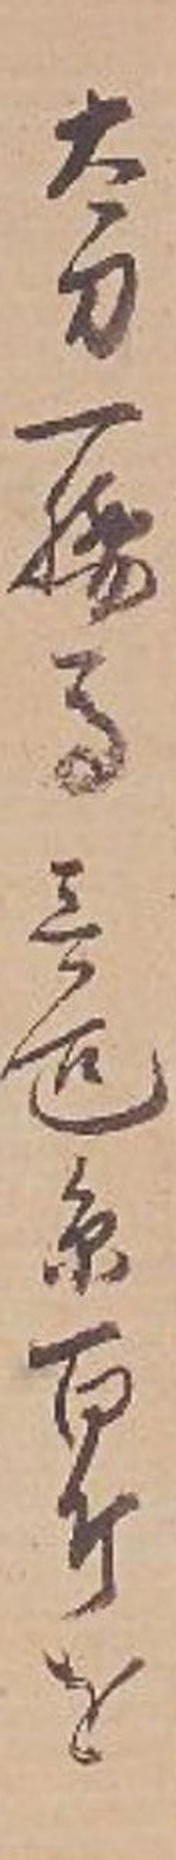太刀一腰馬壱匹糸百斤を
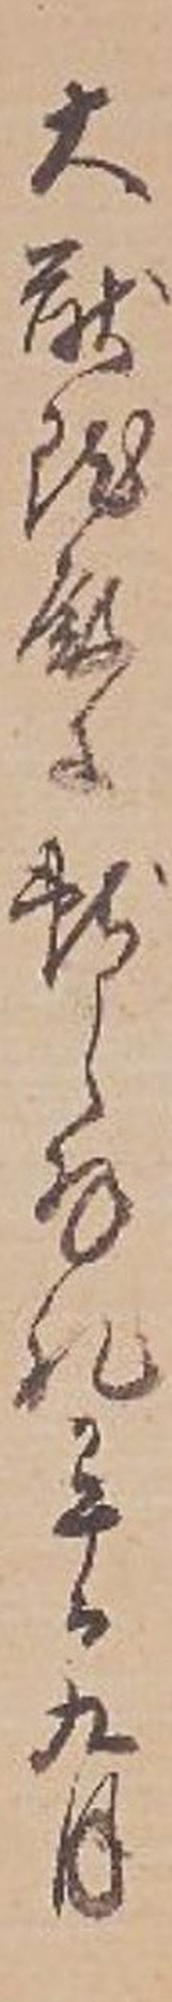大猷院殿に献し拝礼か畢而九月
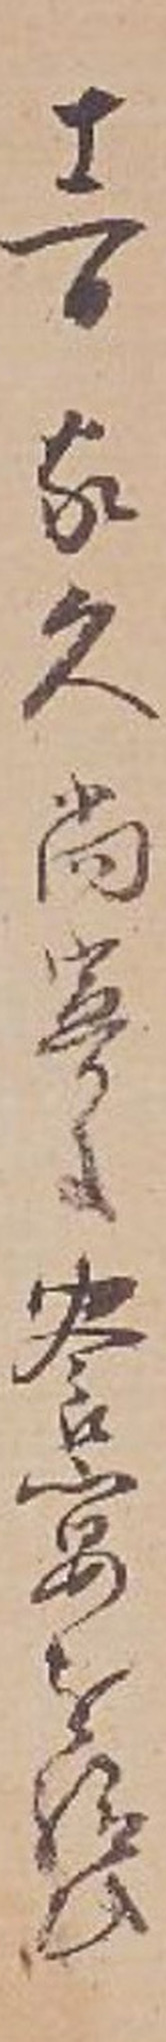十一日家久尚寧に饗宴を給ひ
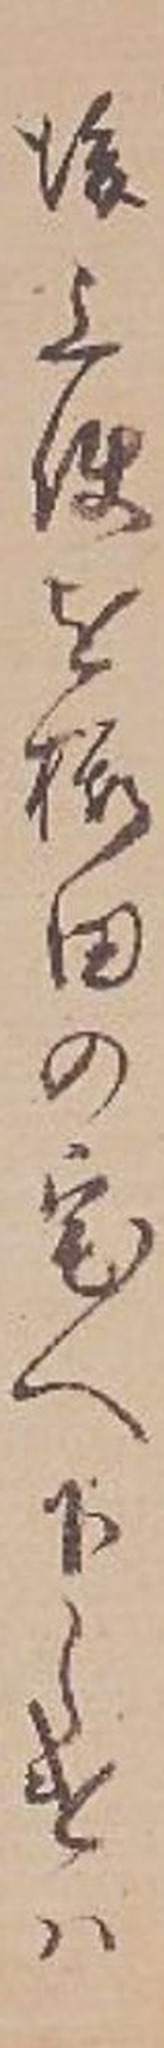後上使を桜田の宅へ下し遣ハ
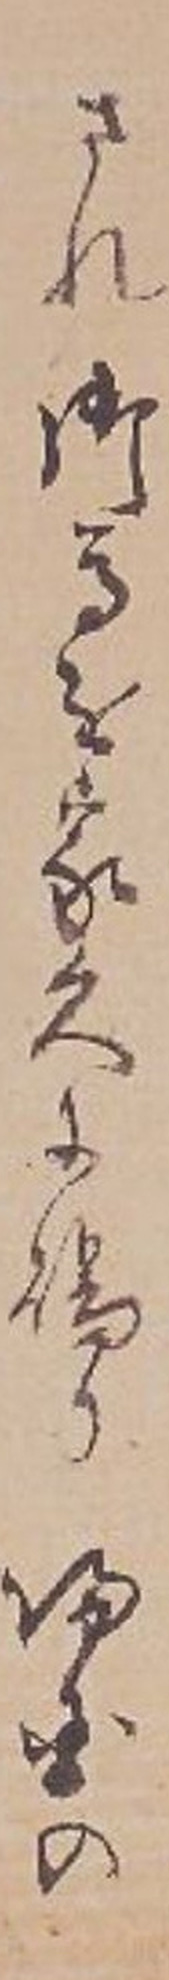され御馬を家久に賜り帰国の
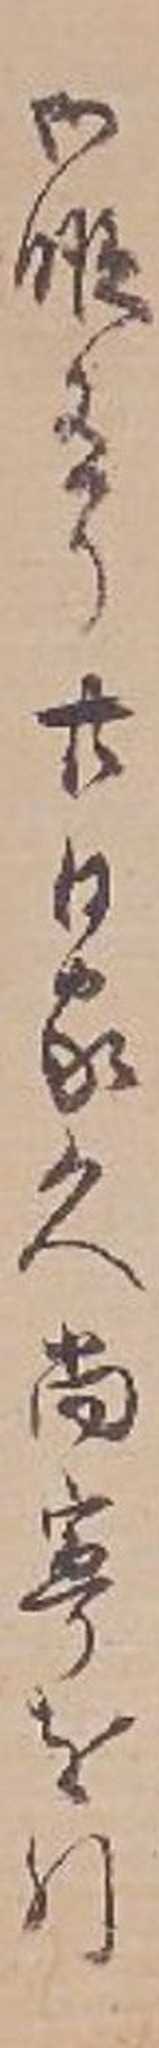御暇有り廿日家久尚寧を引

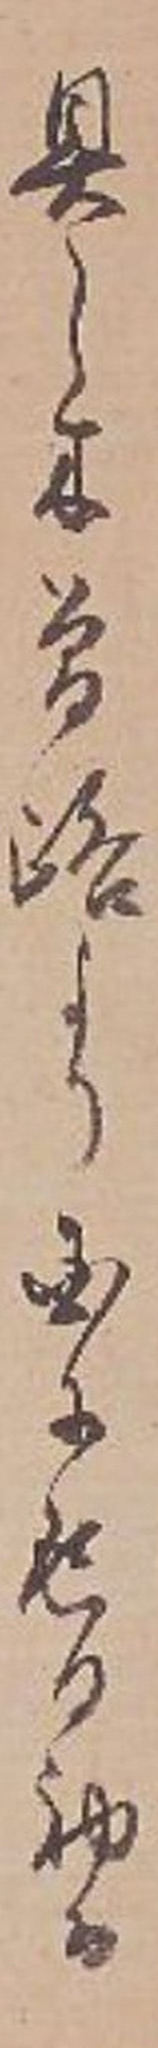具し木曽路より国に返る初而
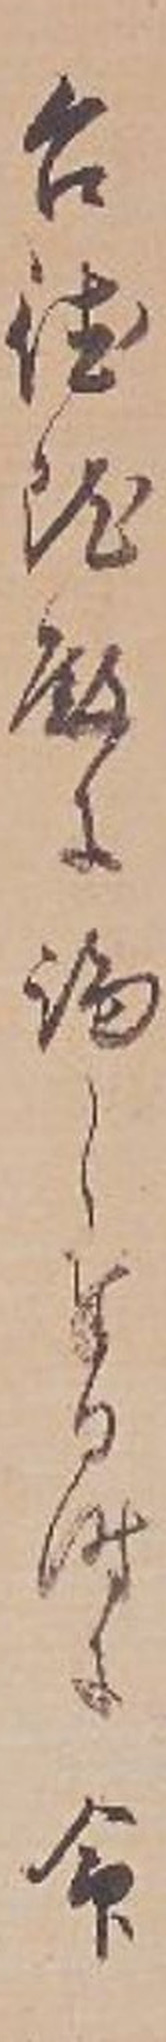台徳院殿に謁し奉る時に命
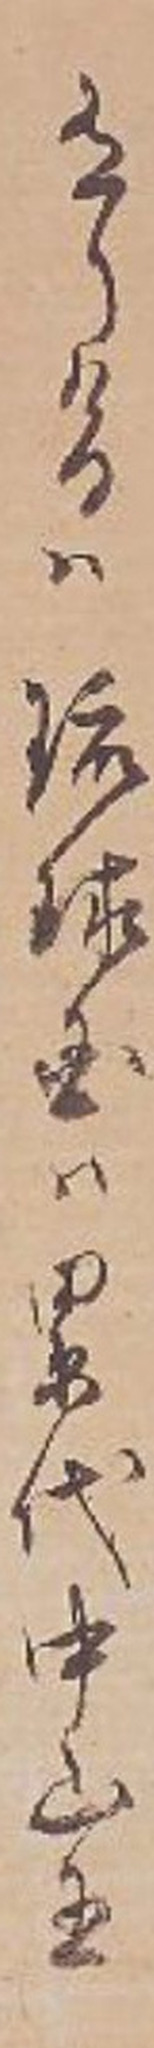有りけるハ琉球国ハ累代中山王
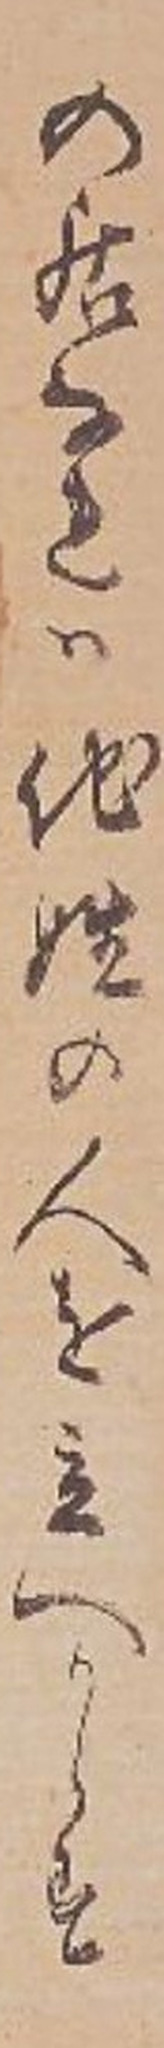の居なれハ他姓の人を立へからす
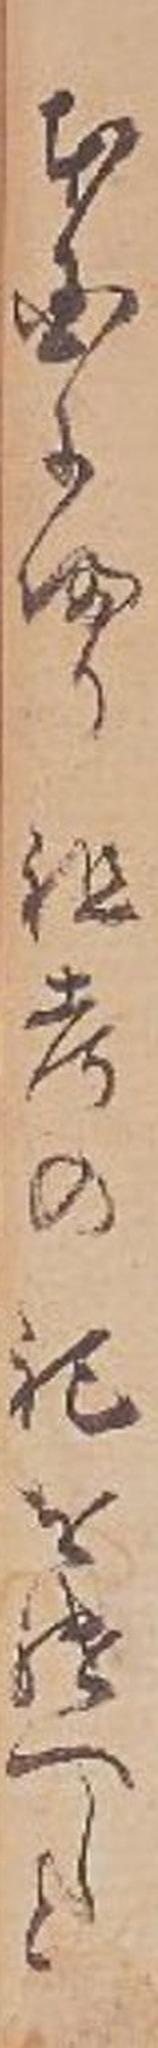本国に帰り祖考の祀を継へしと
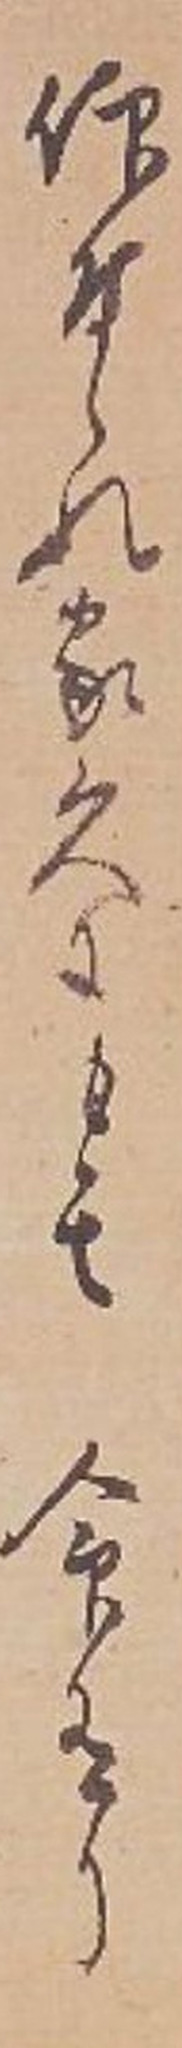仰付られ家久にも其命有り
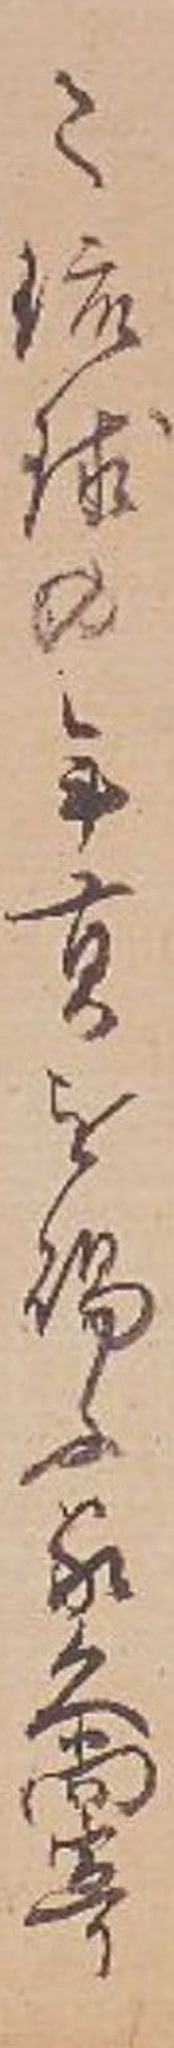て琉球の年貢を賜ふ家久尚寧
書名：琉球人来朝記 一、二
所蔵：University of the Ryukyus Library
